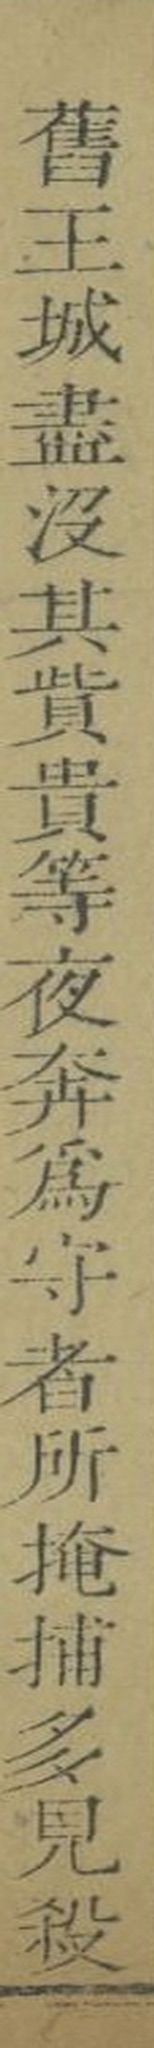旧王城尽没其貲貴等夜奔為守者所掩捕多見殺
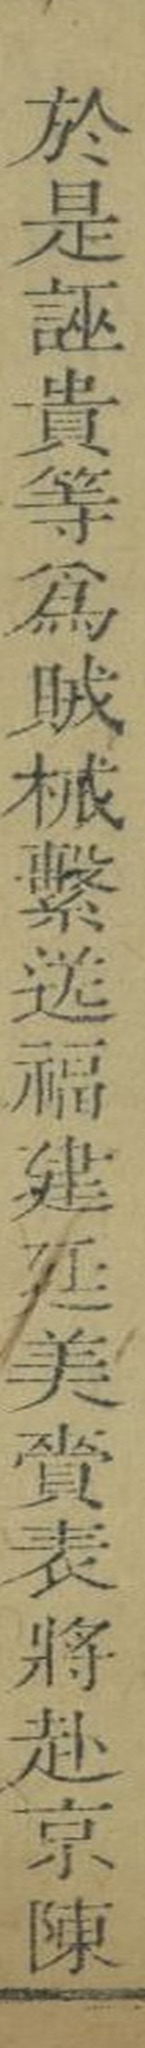於是誣貴等為賊械繋送福建廷美賚表将赴京陳
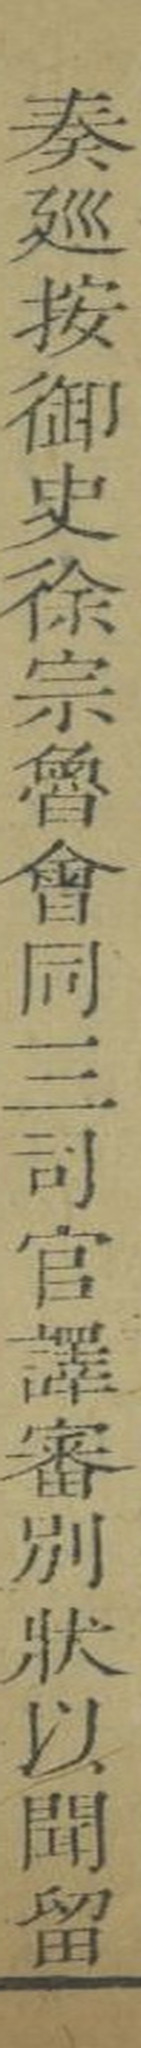奏巡按御史徐宗魯会同三司官訳審別状以聞留
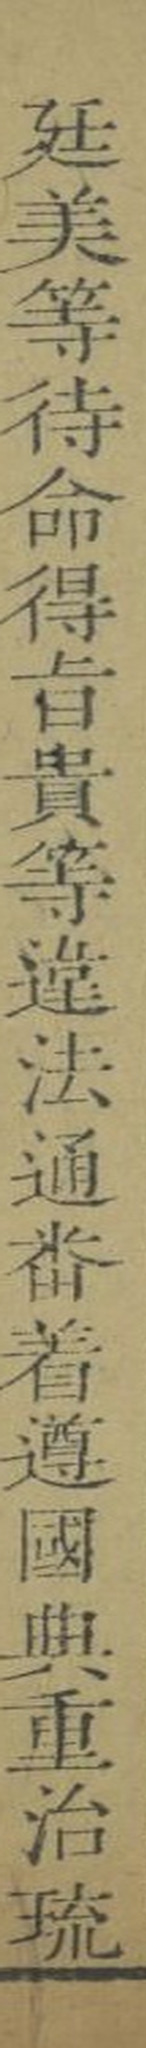廷美等待命得旨貴等違法通畨着遵国典重治琉
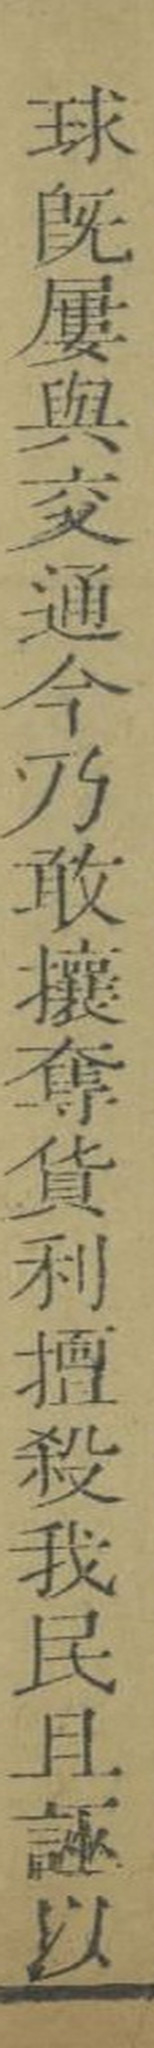球既屢与交通今乃敢攘奪貨利擅殺我民且誣以
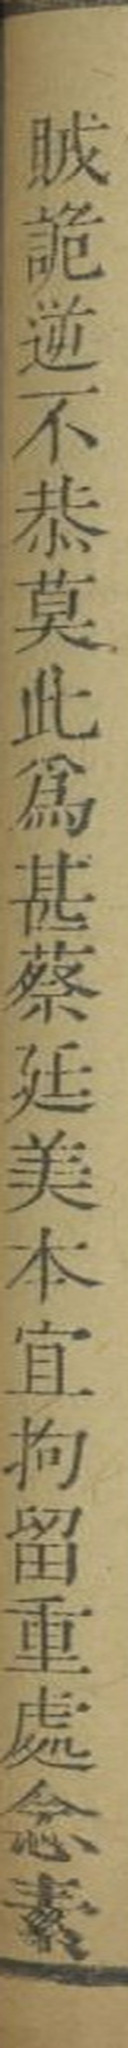賊詭逆不恭莫此為甚蔡廷美本宜拘留重処念素
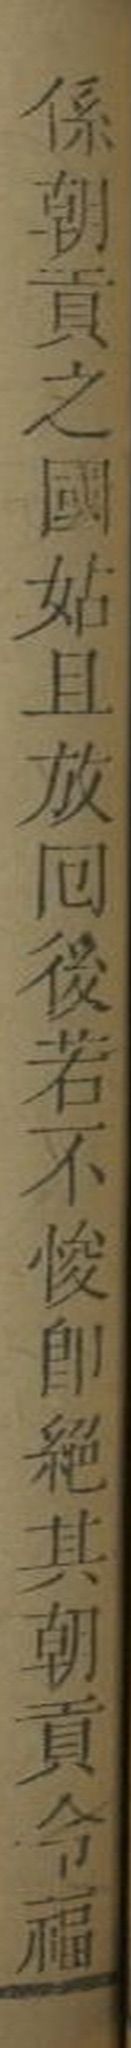係朝貢之国㚲且放回後若不悛即絶其朝貢令福
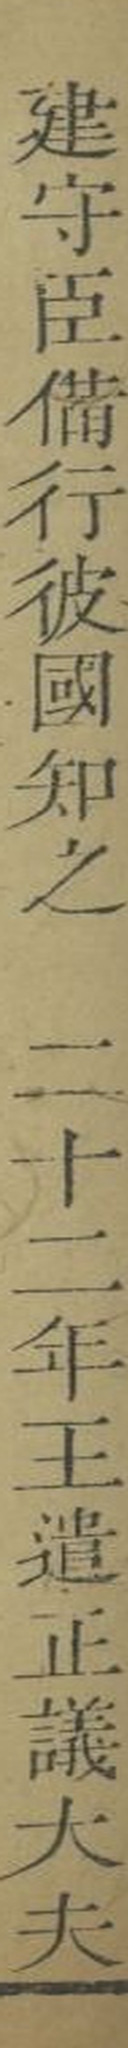建守臣備行彼国知之二十二年王遣正議大夫
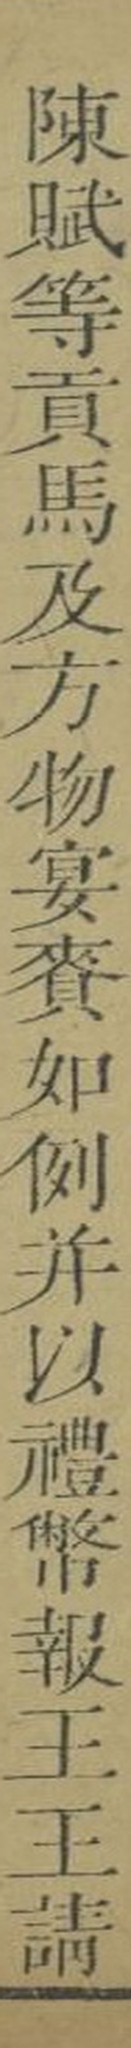陳賦等貢馬及方物宴賚如例并以礼幣報王王請
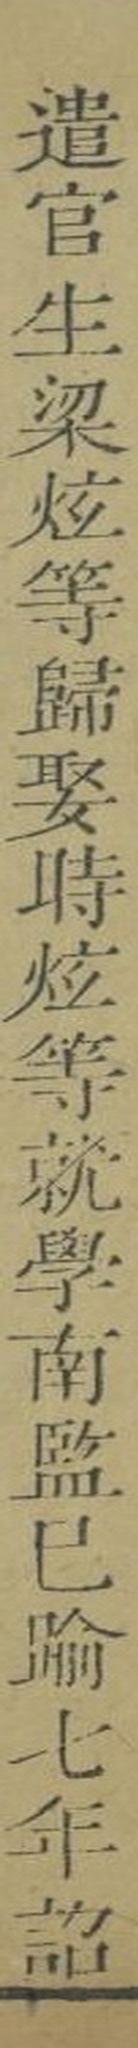遣官生梁炫等帰娶時炫等就学南監巳踰七年詔
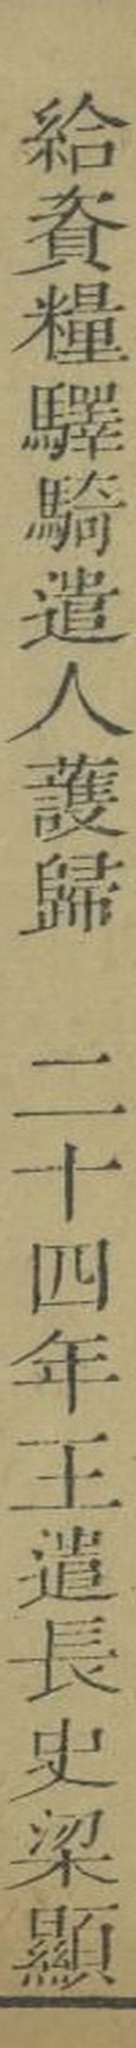給資糧駅騎遣人護帰二十四年王遣長史梁顕
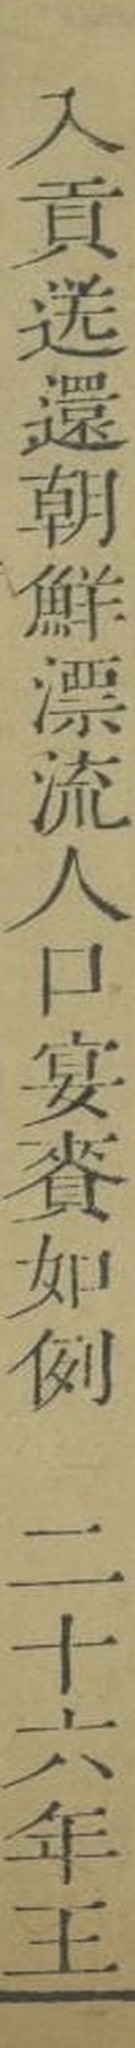入貢送還朝鮮漂流人口宴賚如例二十六年王
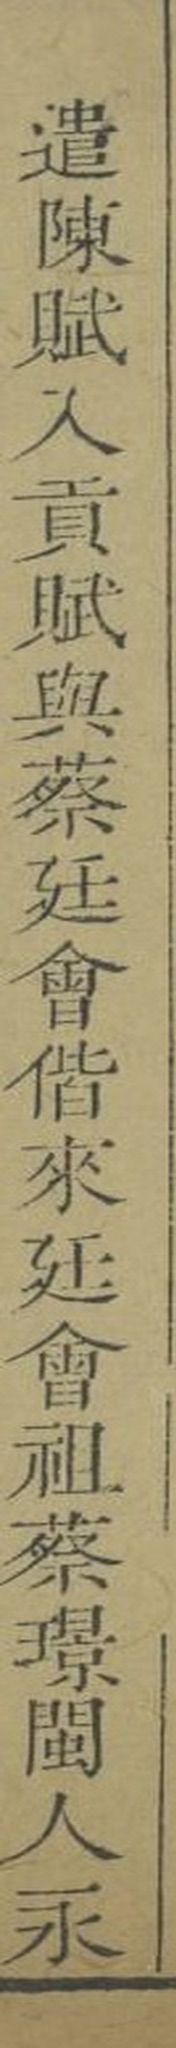遣陳賦入貢賦与蔡廷会偕来廷会祖蔡璟閩人永
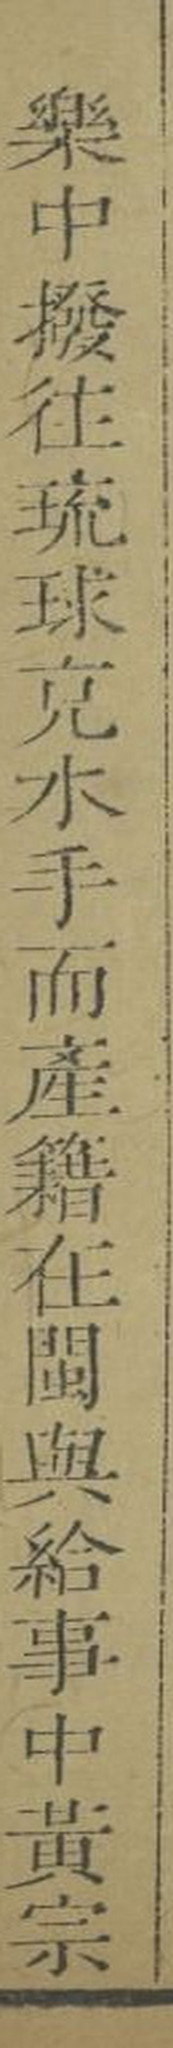楽中撥往琉球克水手而産籍在閩与給事中黄宗
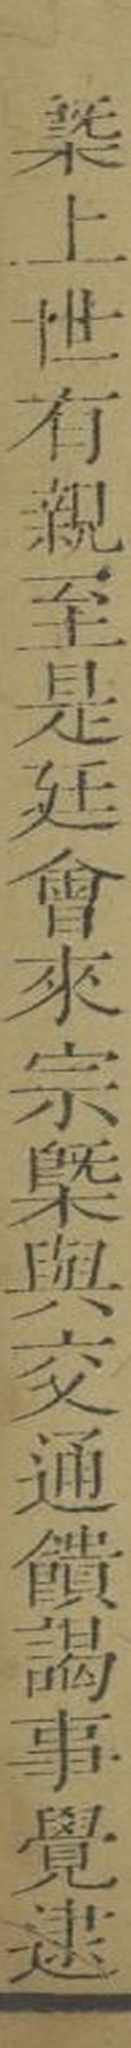概上世有親至是廷会来宗概与交通饋謁事覚逮

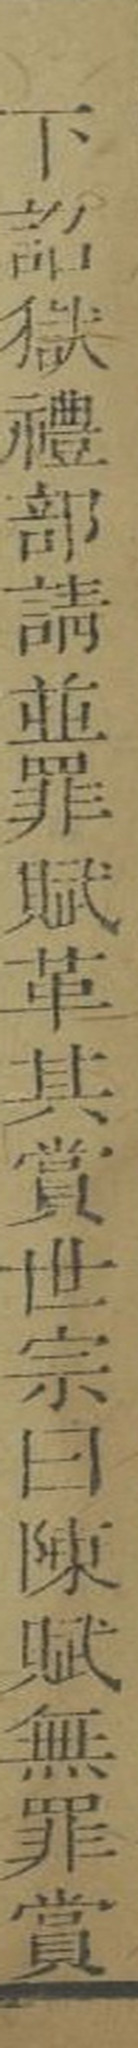下詔獄礼部請並罪賦革其賞世宗曰陳賦無罪賞
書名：中山伝信録 巻三
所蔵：University of the Ryukyus Library
